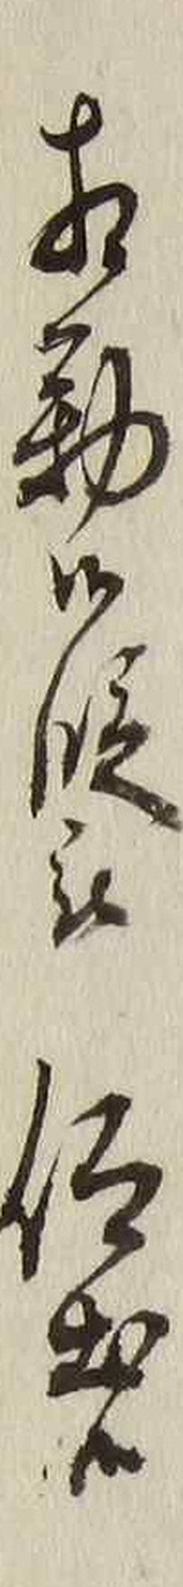相勤御段被仰出候
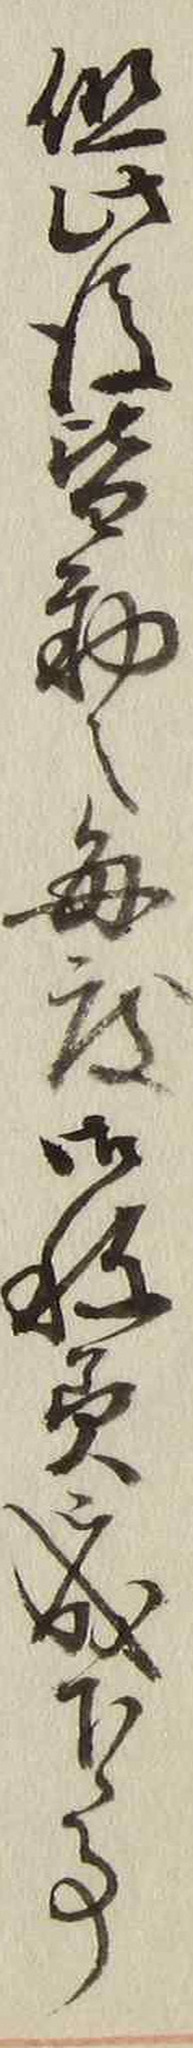但此後皆勤之毎度御称美被成下候事
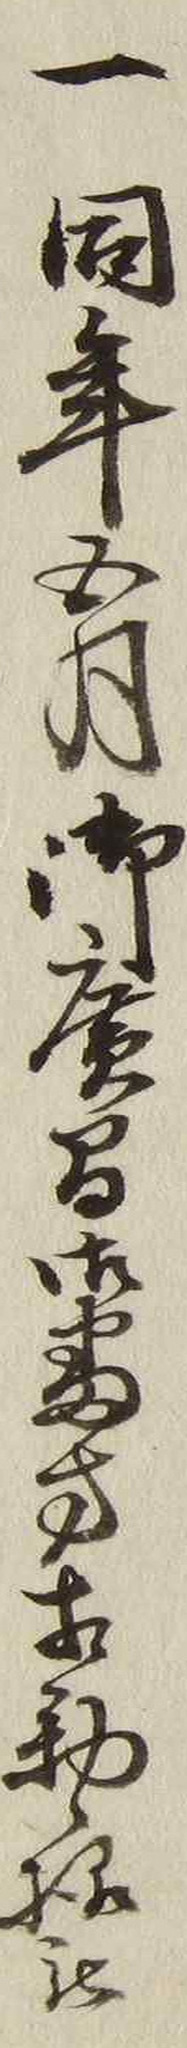一同年五月御広間御番方相勤候様被
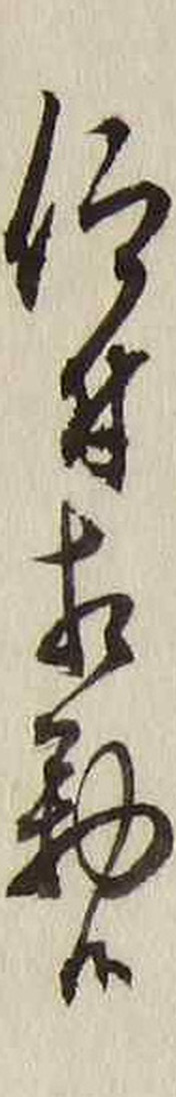仰付相勤候
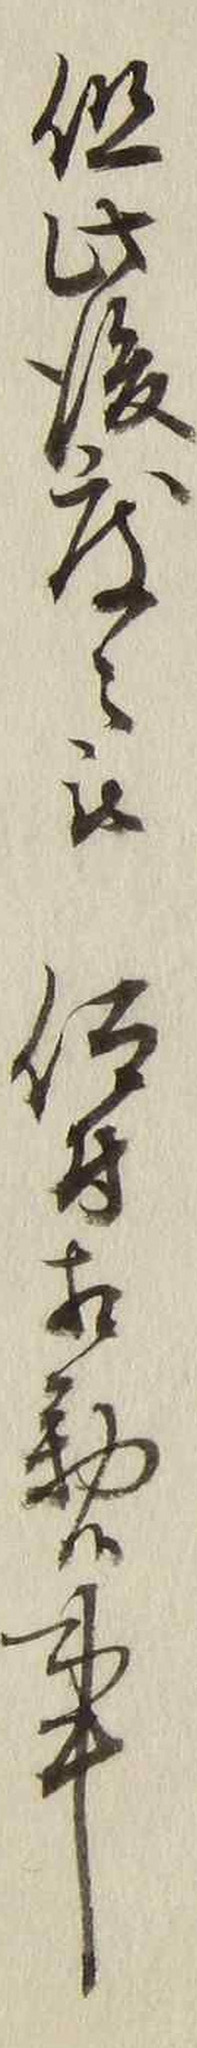但此後度々被仰付相勤候事

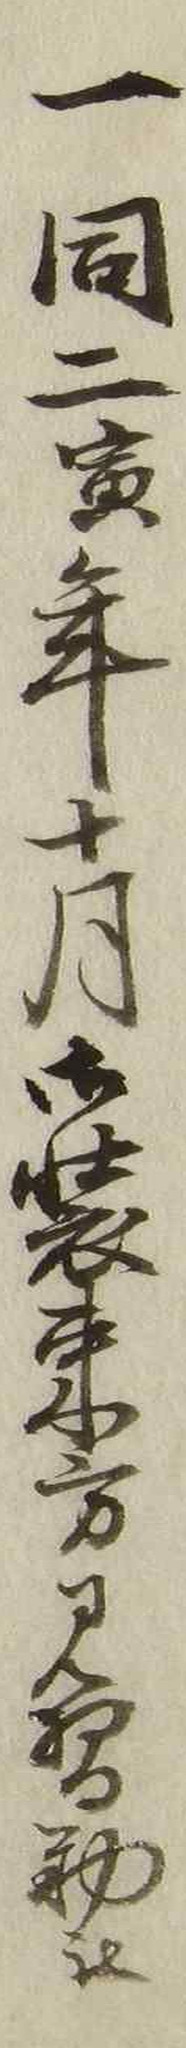一同二寅年十月御装束方見習勤被
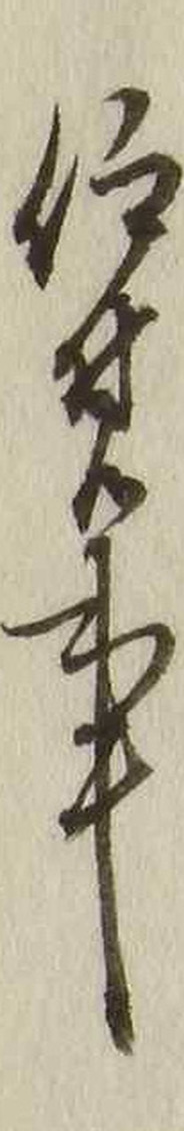仰付候事
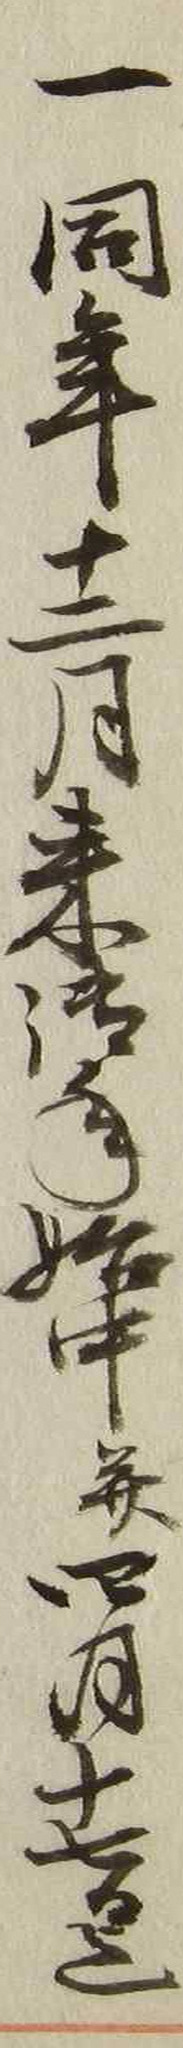一同年十二月来御年始中并四月十七日迄
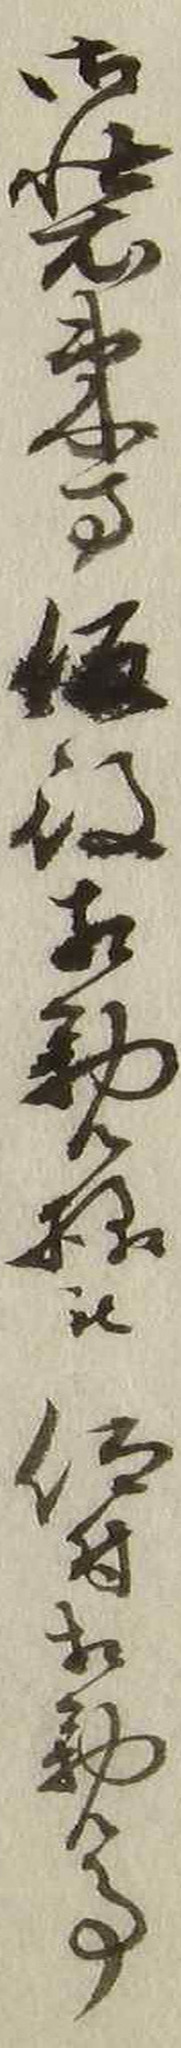御装束方仮役相勤候様被仰付相勤候事
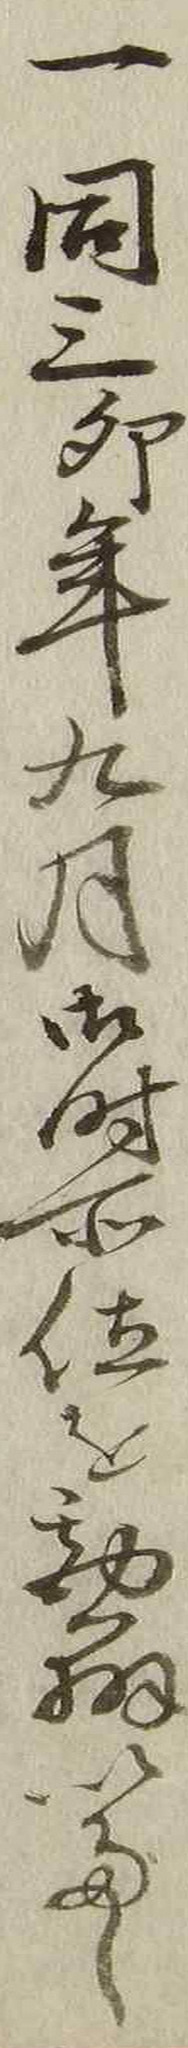一同三卯年九月御時所位を勘弁いたし
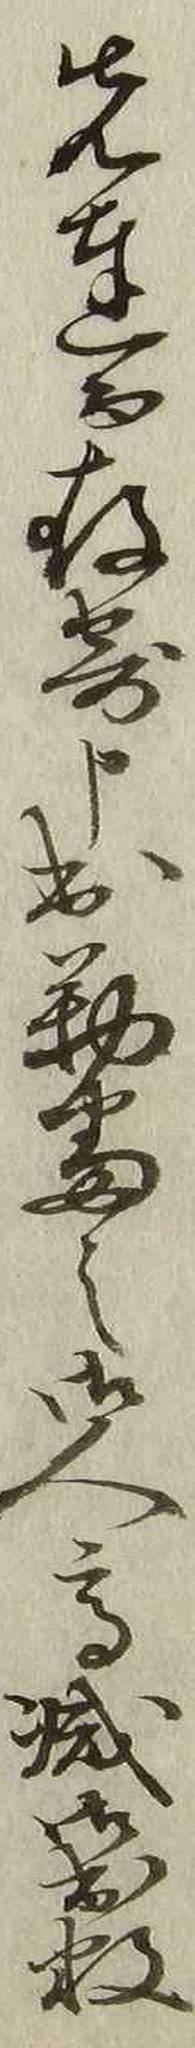先達而存寄申出勤番之御人高減御出数
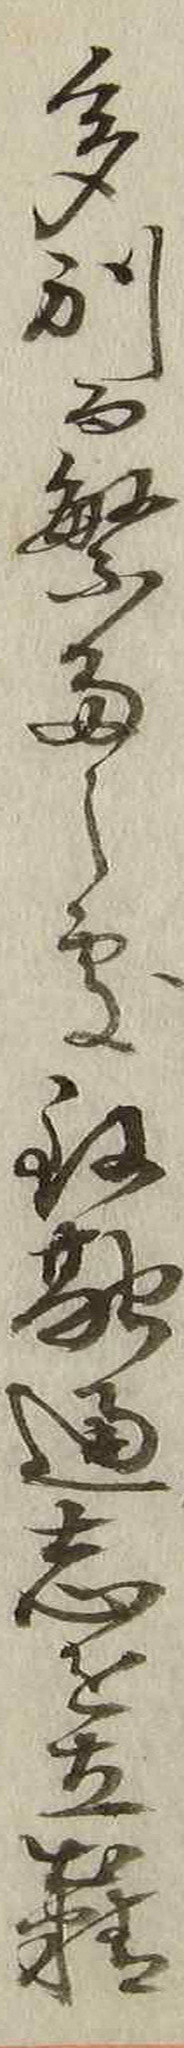多別而繁多之処致融通志を立出精
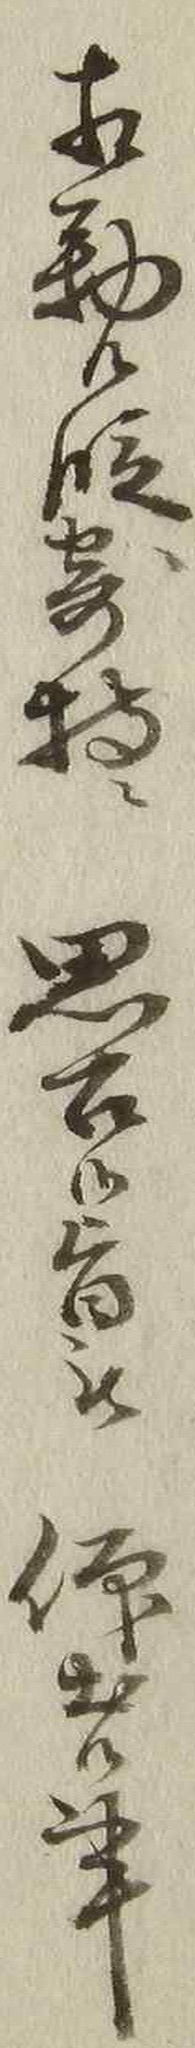相勤候段寄特ニ思召候旨被仰出候事
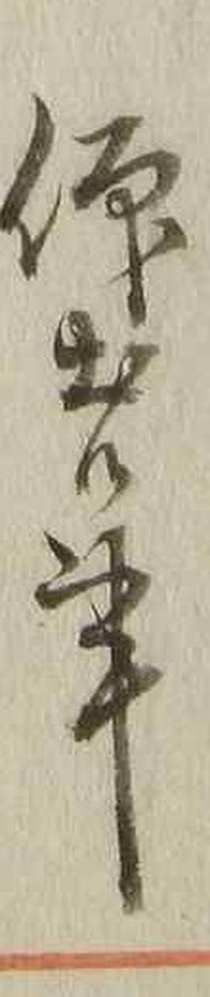仰付候事
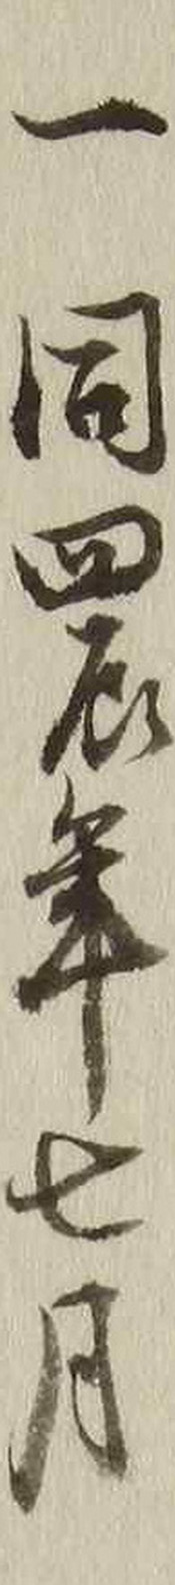一同四辰年七月
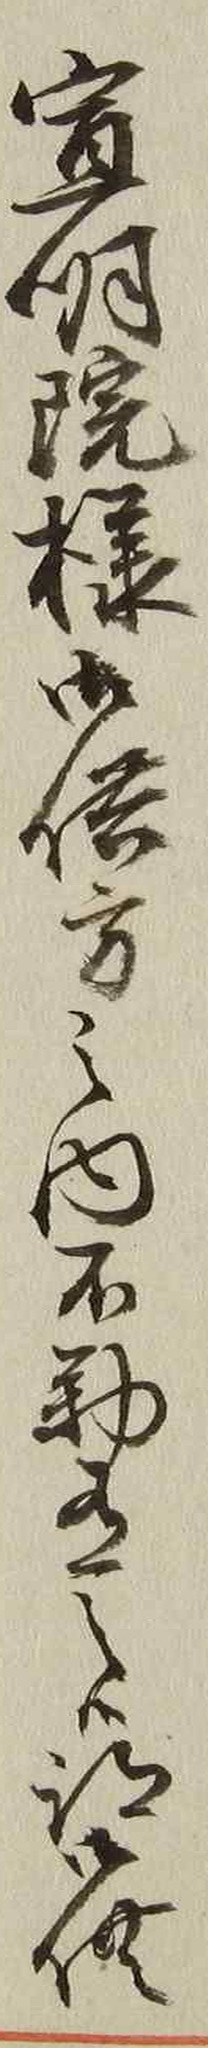宣明院様御供方之内不勤有之ハ跡御供
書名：諸士系譜　巻之23　い之部23
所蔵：会津若松市立会津図書館
